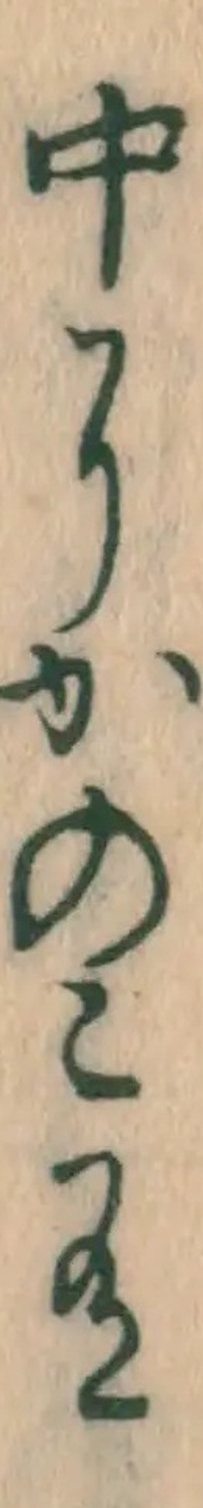中にかのこ有
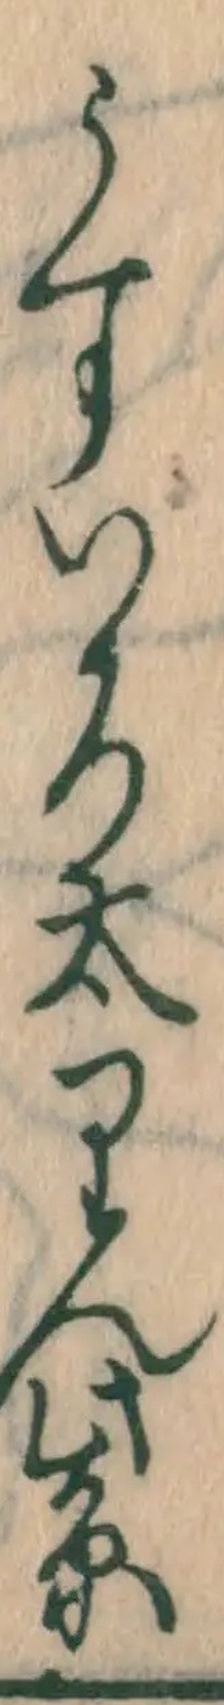うすいろ太りん紫
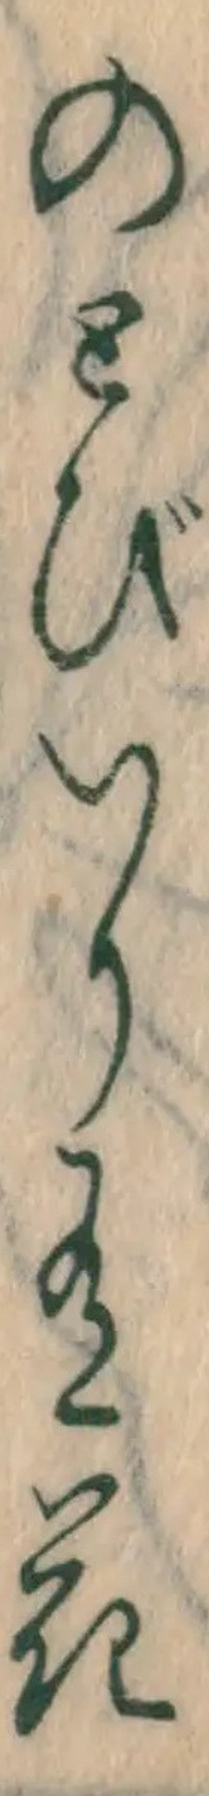のとびいり有花
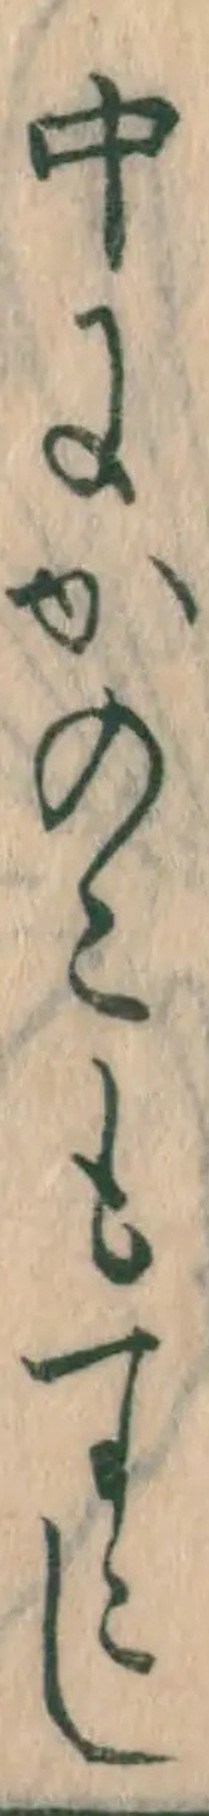中にかのこもすこし
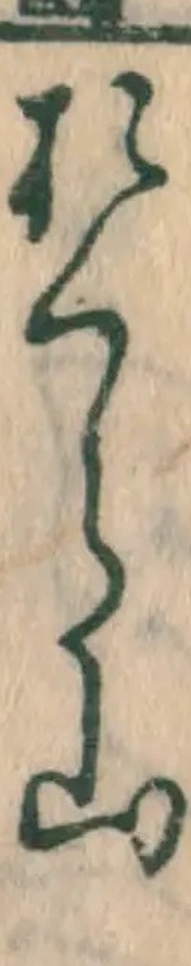おくら山
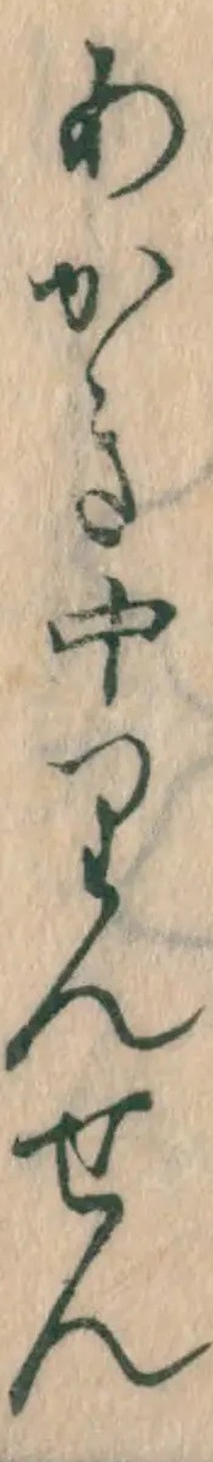あかき中りんせん
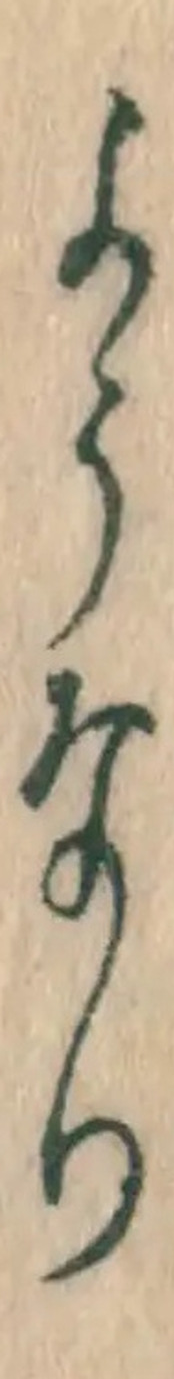ようなり

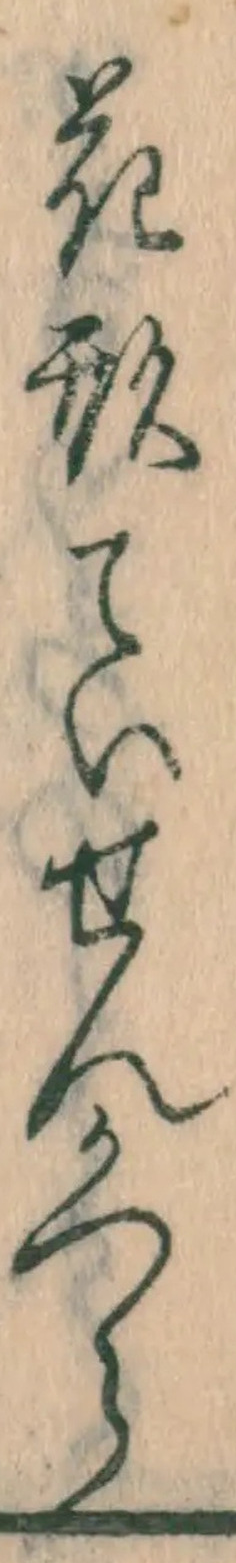花形ていせんかつら
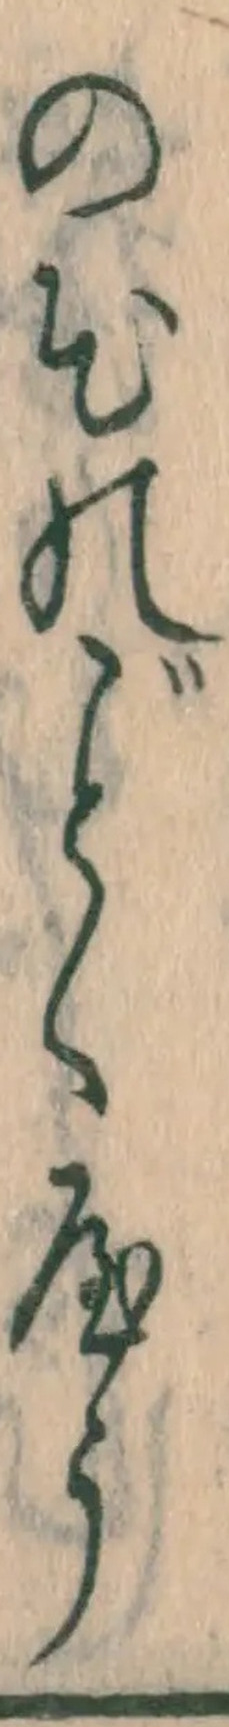の花のごとくやう
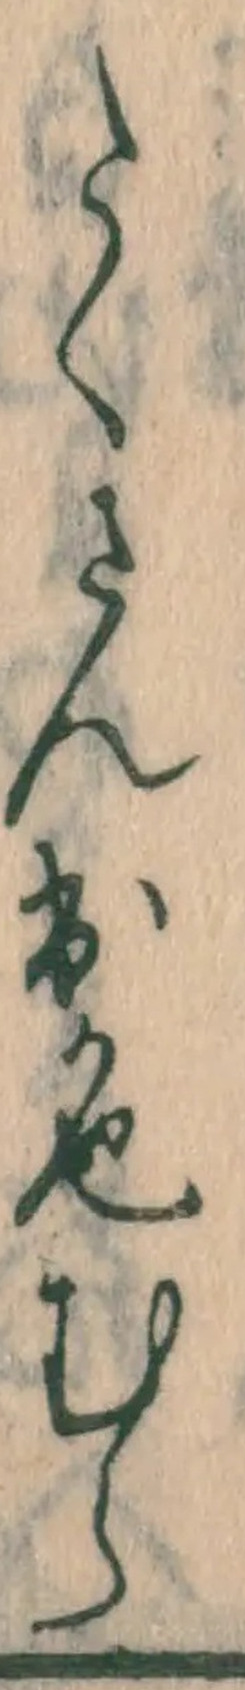たくさん出色むら
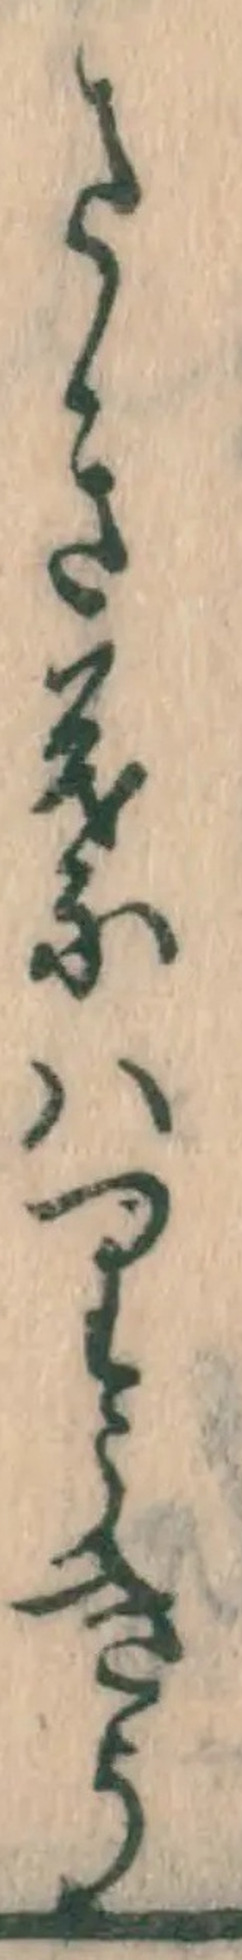さき葉はりうきう
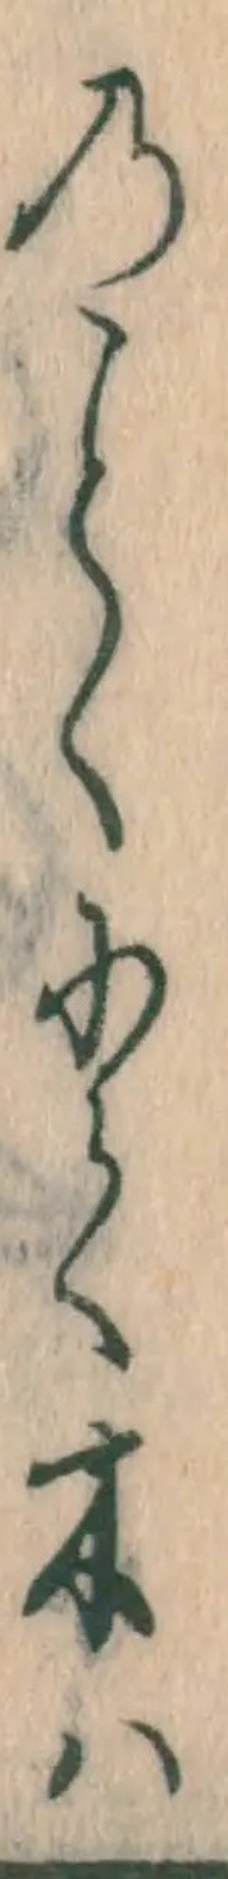のことくにて木は
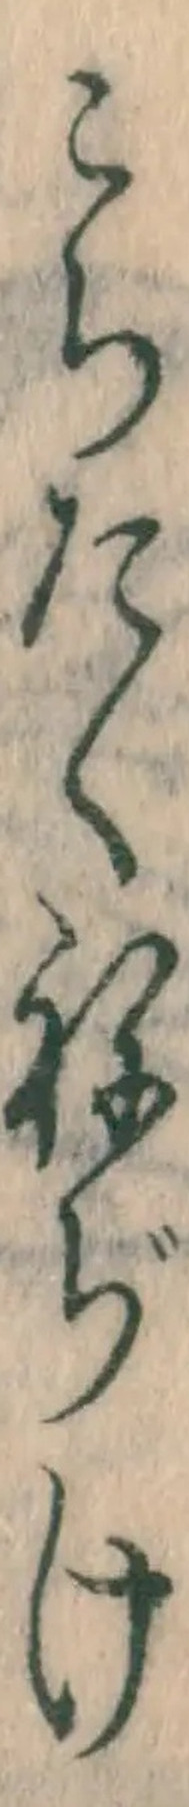こちたくねぢけ
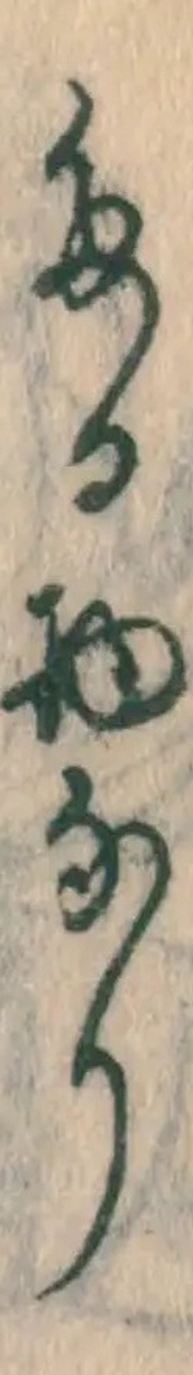たる物なり
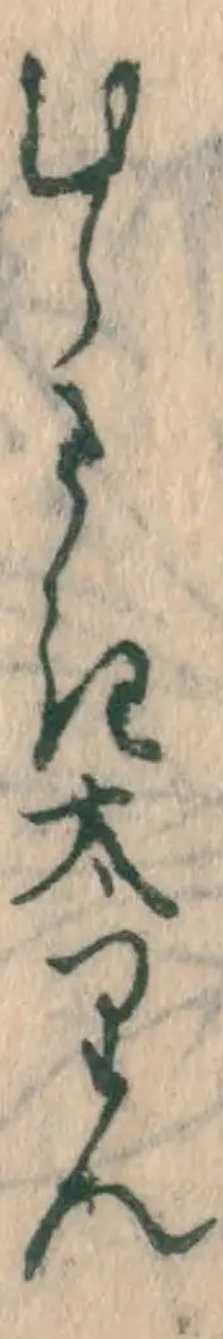むらさき太りん

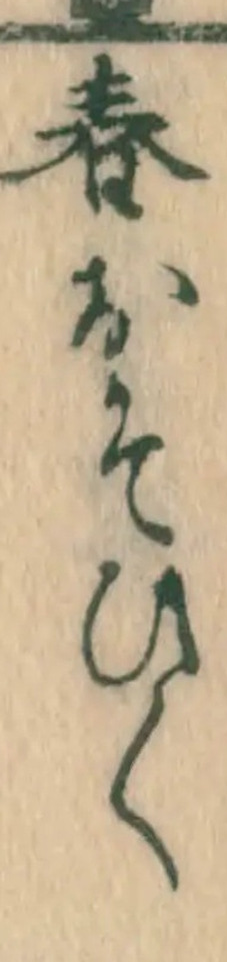春おそひく
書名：錦繍枕 5巻. [3]
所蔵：国立国会図書館 National Diet Library, JAPAN
